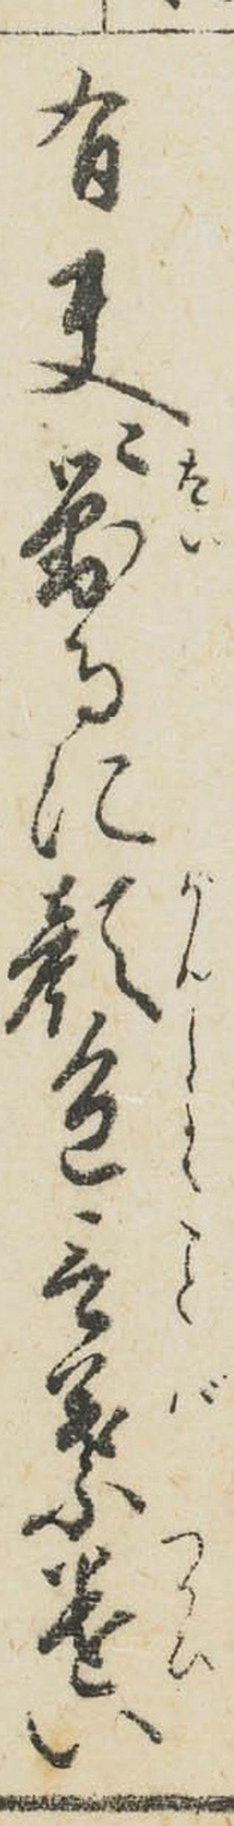有夫対るに顔色言葉遣い
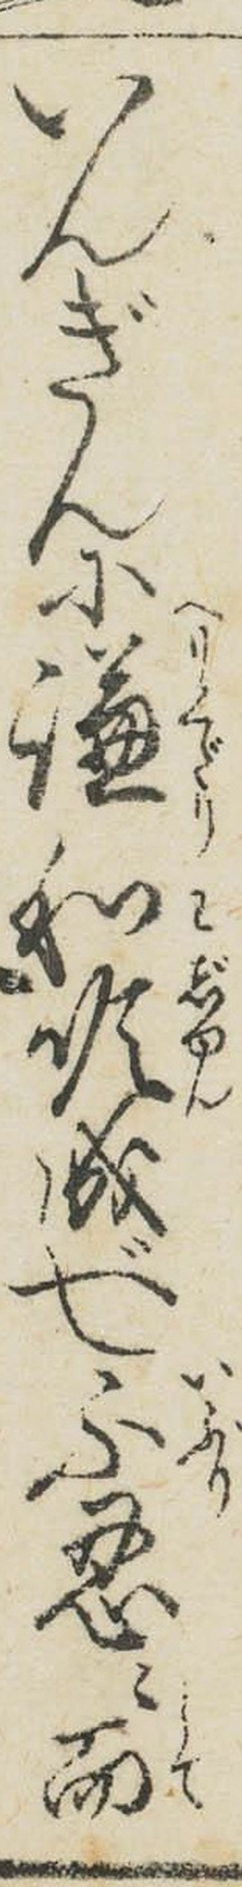いんぎんに謙和順成べし不忍而
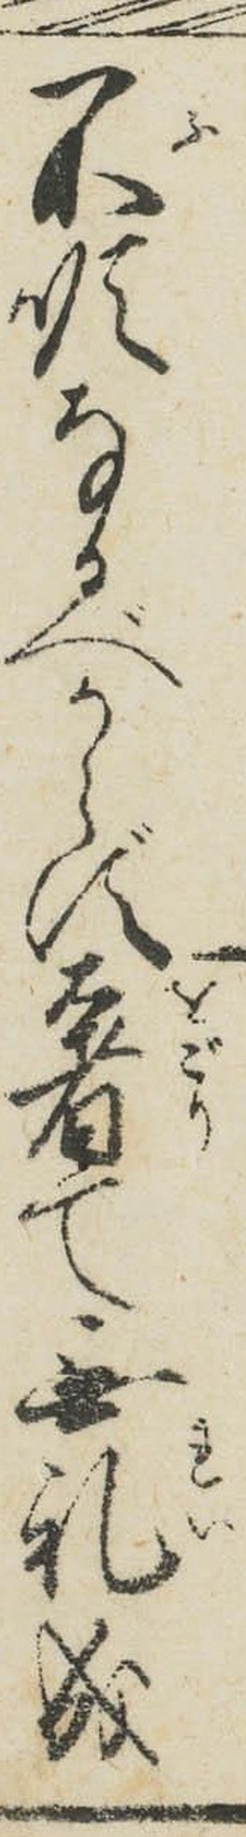不順なるべからず奢て無礼成
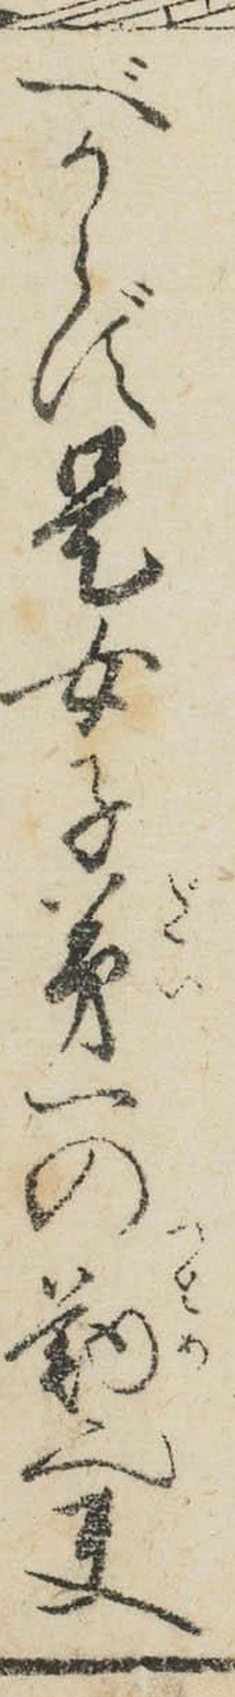べからず是女子第一の勤也夫
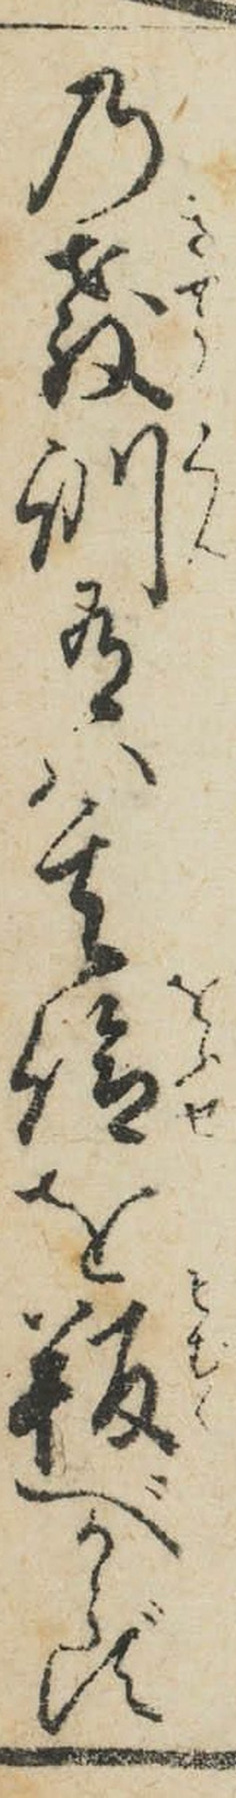の教訓有は其仰を叛べからず

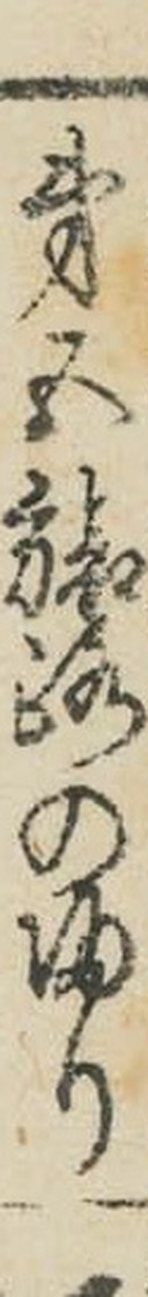第五旅路の帰り
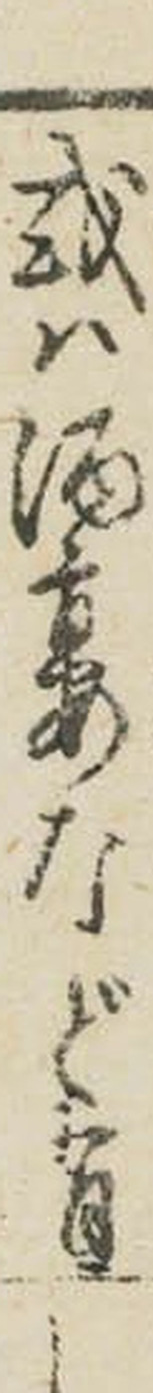或は酒宴など有
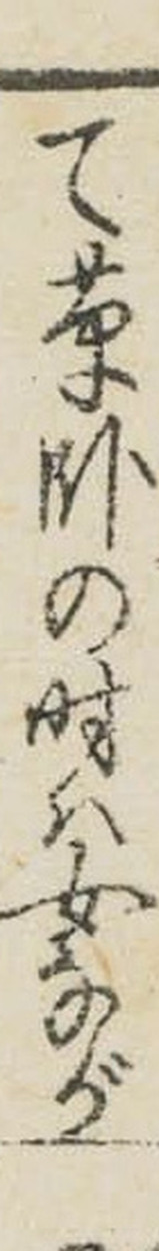て草臥の時は女なが
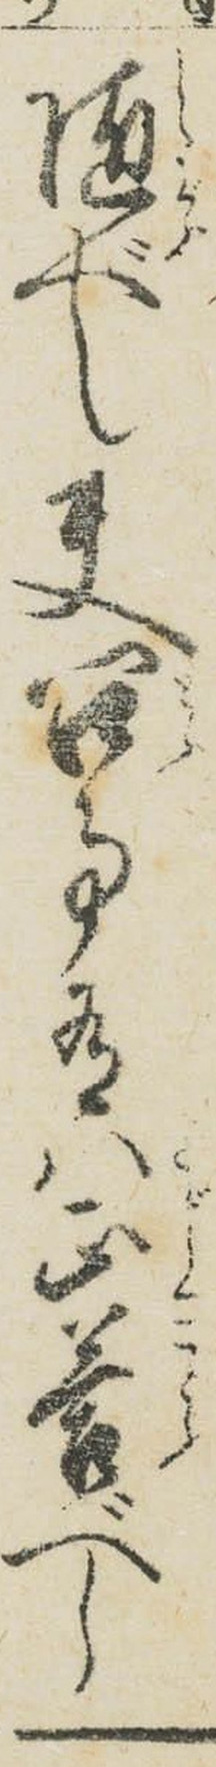随べし夫問事有は正答べし
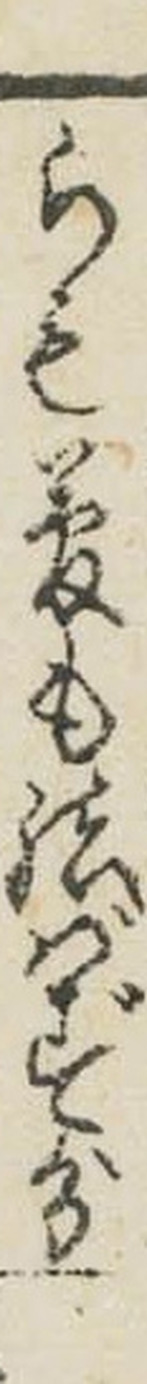らも夢も結ばず分
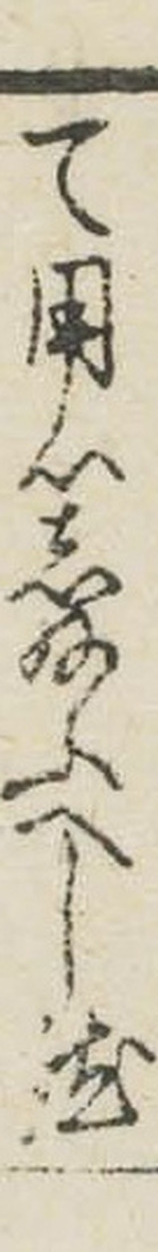て用心し給ふへし然
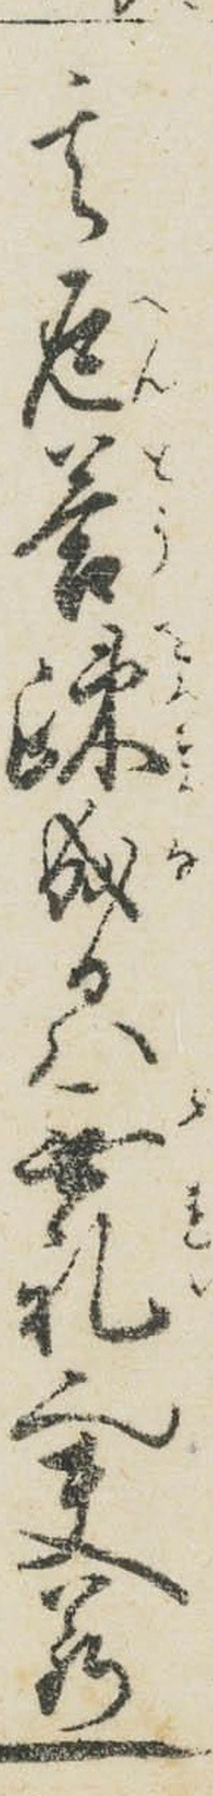其返答疎成るは無礼也夫若
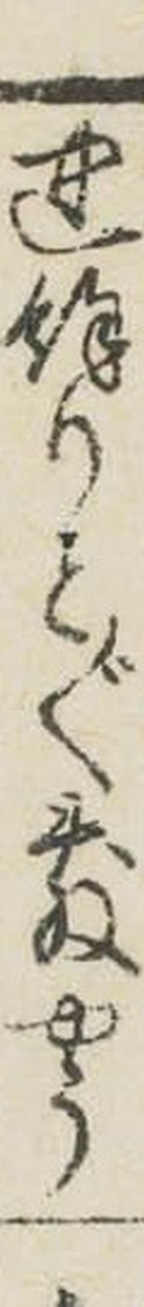迚余りこと〴〵敷やう
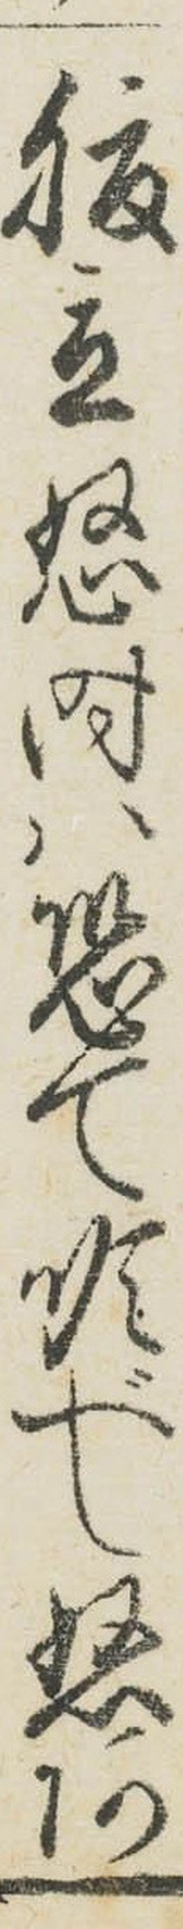腹立怒時は恐て順べし怒あ
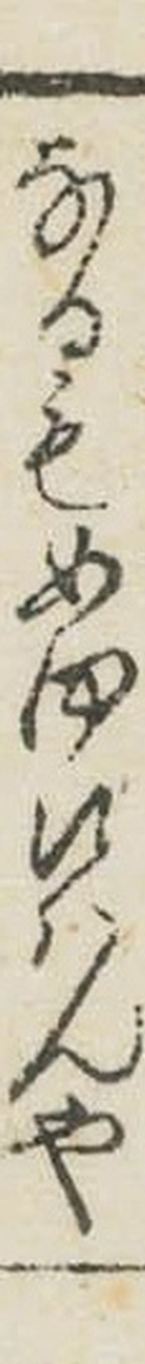なるも如何候はんや
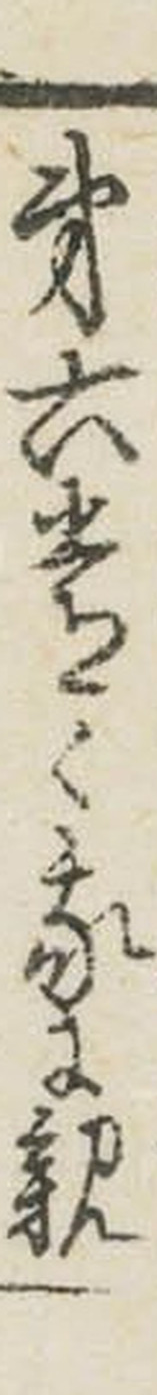第六常々我に親
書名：女大学
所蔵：東京学芸大学教育コンテンツアーカイブ
